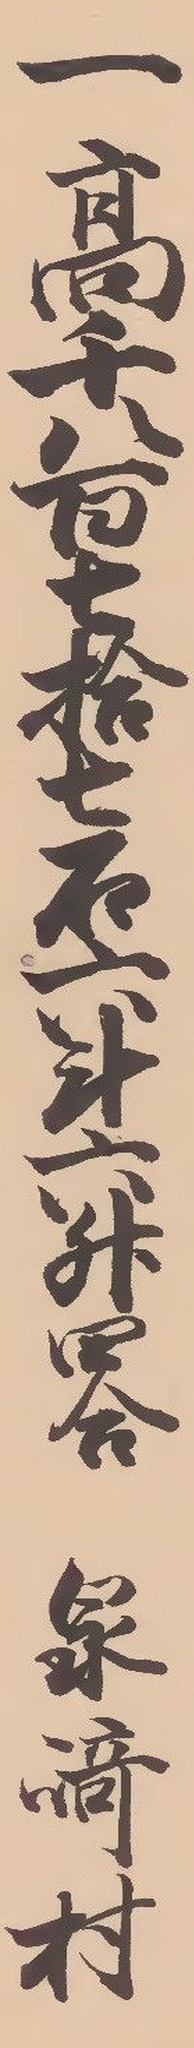一高千八百七拾七石六斗六升四合泉崎村

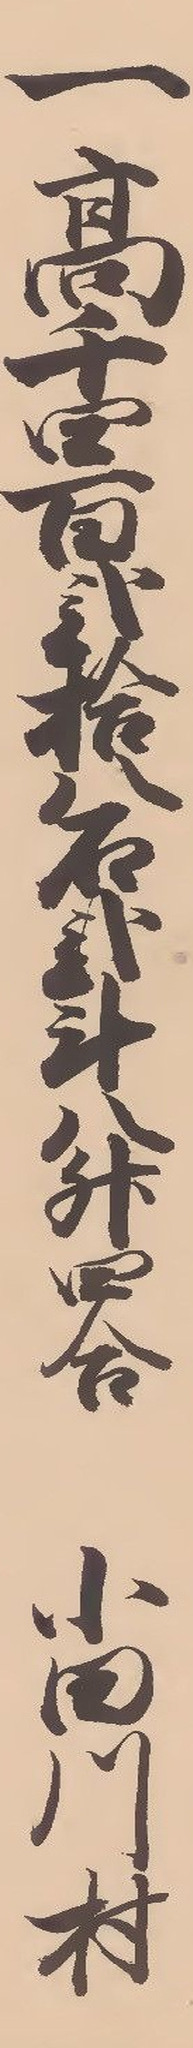一高千四百弐拾八石八弐斗八升四合小田川村
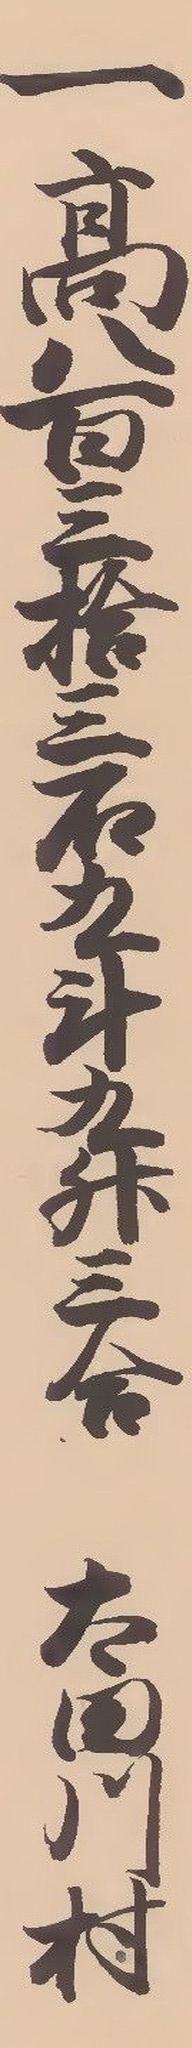一高八百三拾三石九斗九升三合太田川村
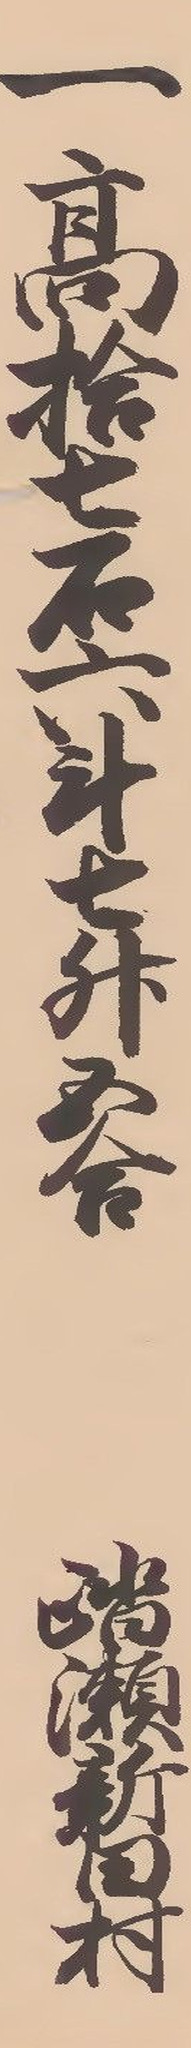一高拾七石六斗七升五合踏瀬新田村
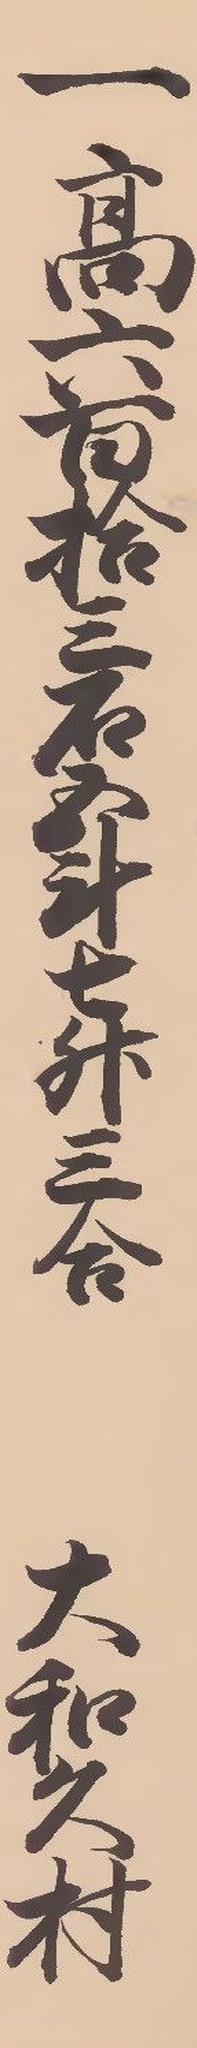一高六百拾三石五斗七升三合大和久村
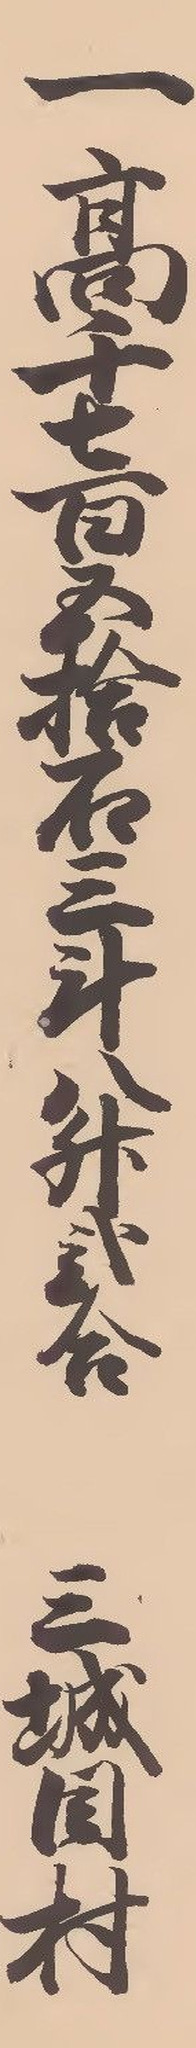一高千七百五拾石三斗八升弐合三城目村
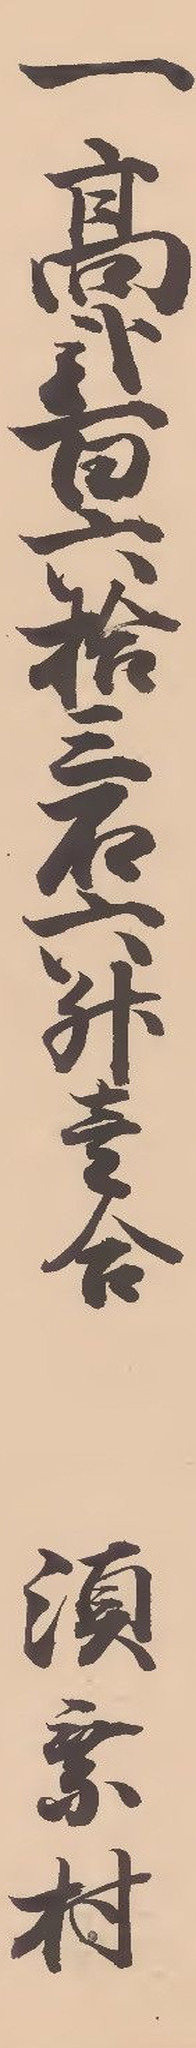一高弐百六拾三石六升壱合須乗村
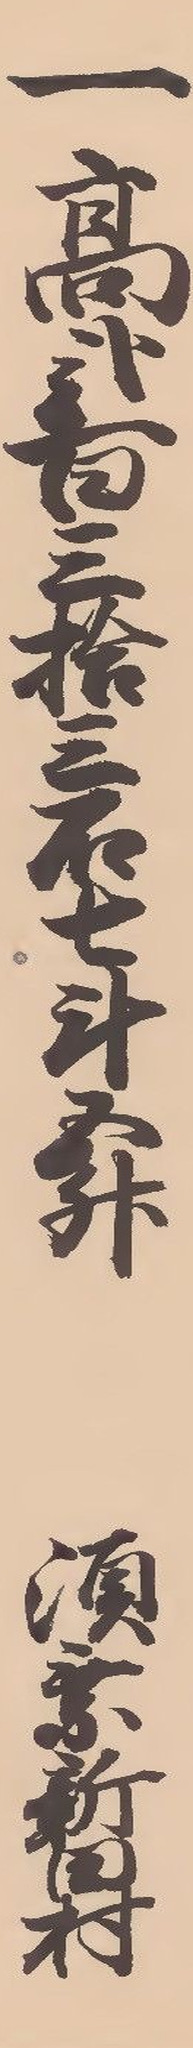一高弐百三拾三石七斗五升須乗新田村

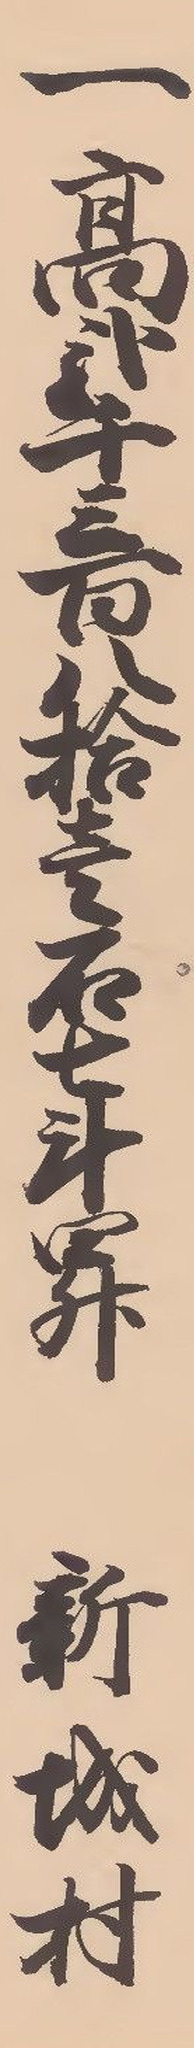一高弐千三百八拾壱石七斗四升新城村
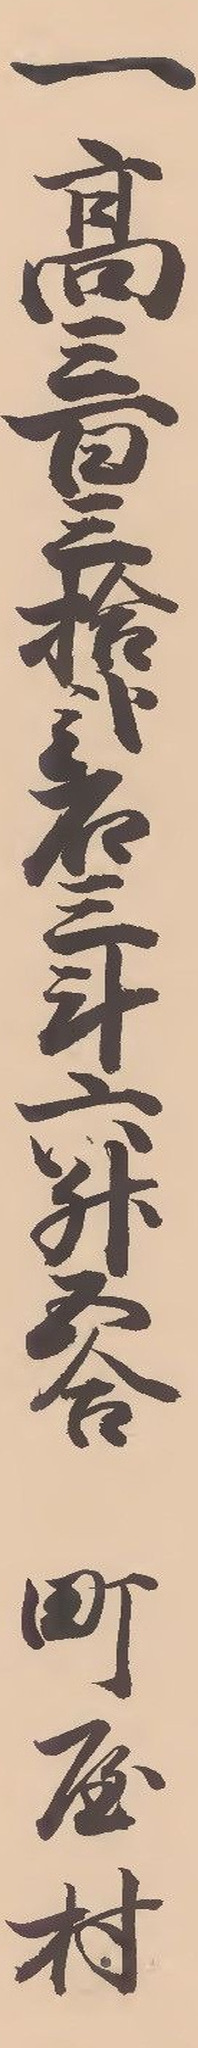一高三百三拾弐石三斗六升五合町屋村
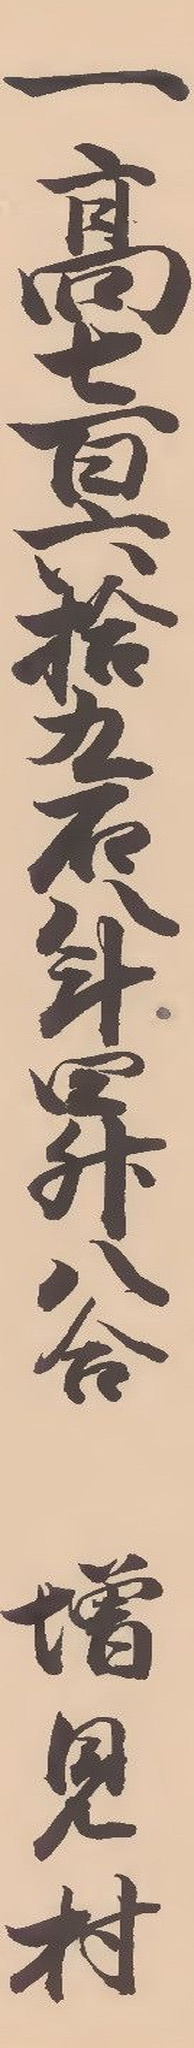一高七百六拾九石八斗四升八合増見村
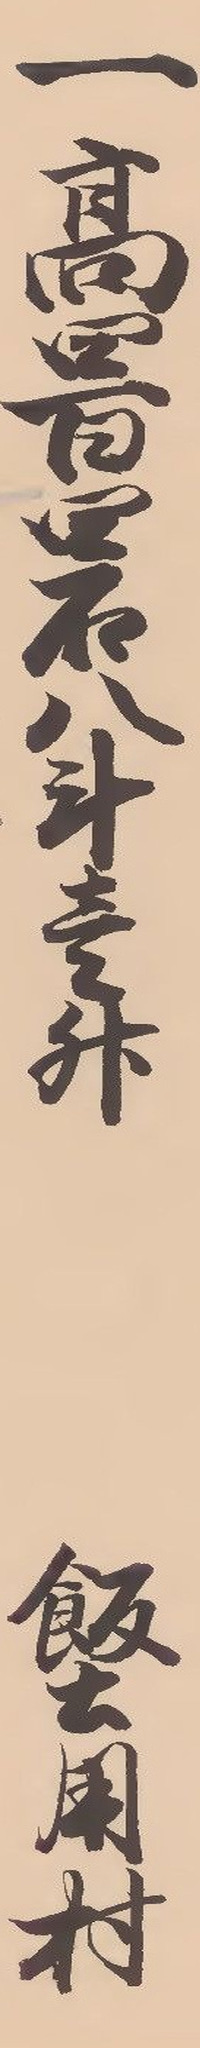一高四百四石八斗壱升飯土用村
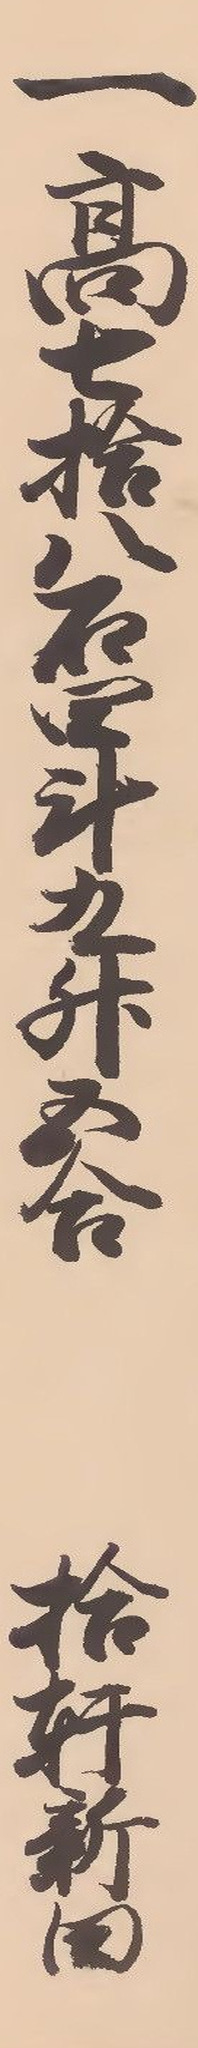一高七拾八石四斗九升五合拾軒新田
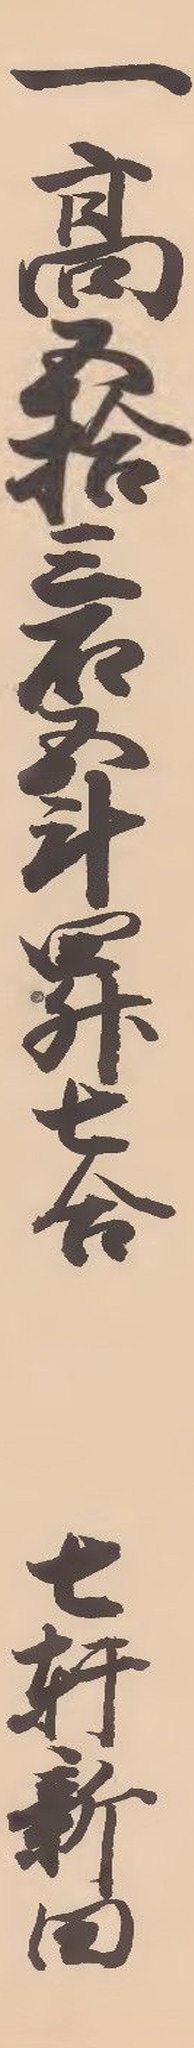一高五拾三石五斗四升七合七軒新田
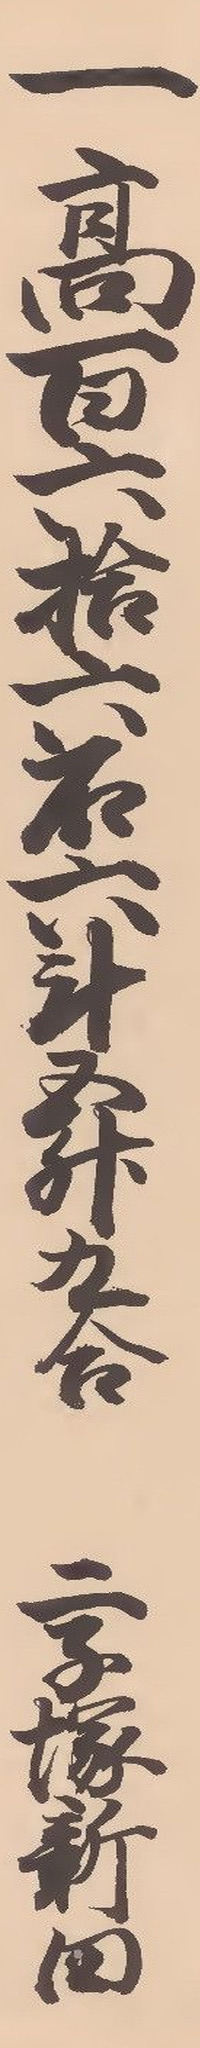一高百六拾六石六斗五升九合二子塚新田
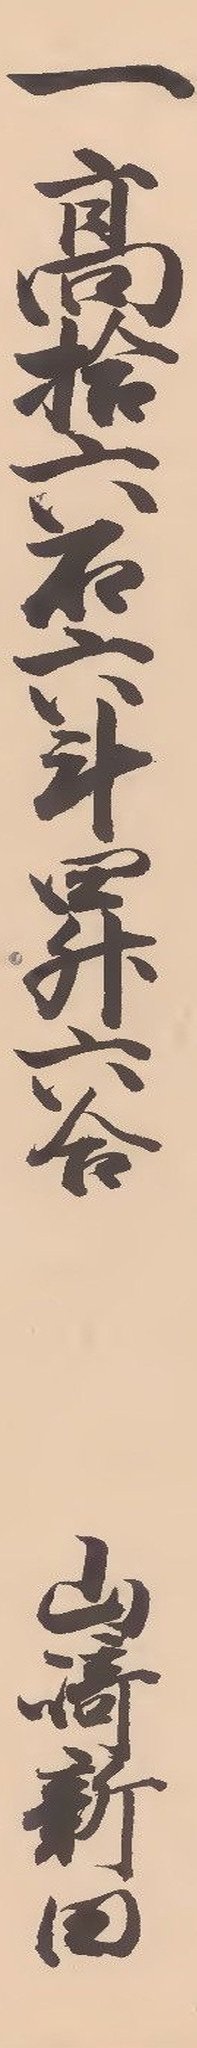一高拾六石六斗四升六合山崎新田
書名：陸奥国郷帳　２
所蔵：国立公文書館 National Archives of Japan
